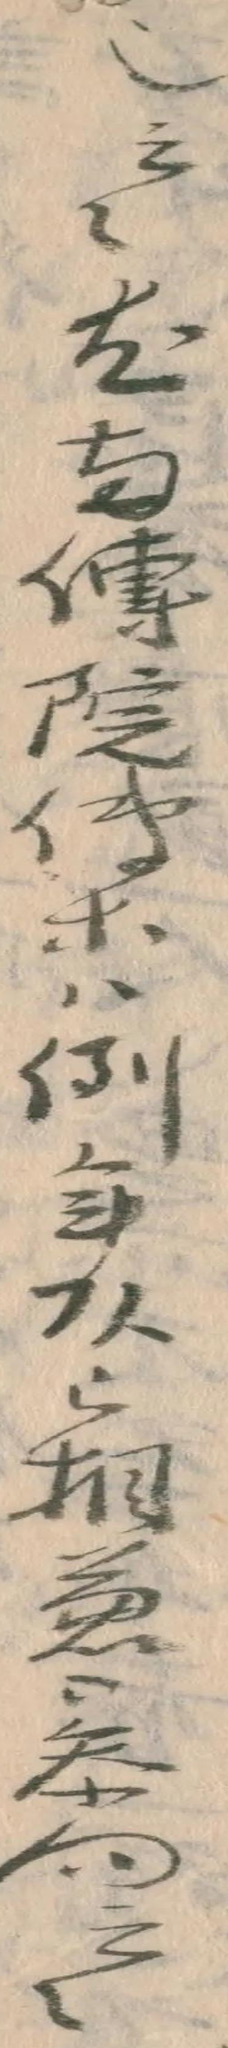也云々尤両傳院傳等ハ例年頭被相兼御参向云々
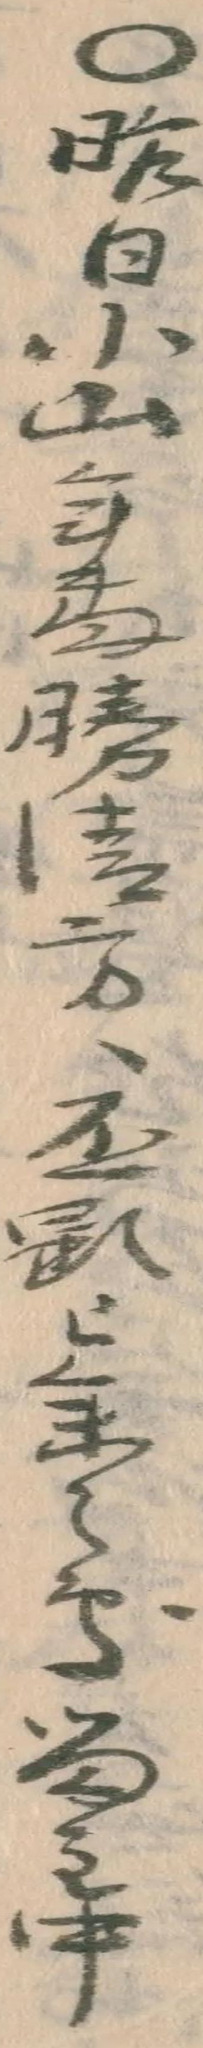○昨日小山年番勝清方へ丕顕被参之處留主中
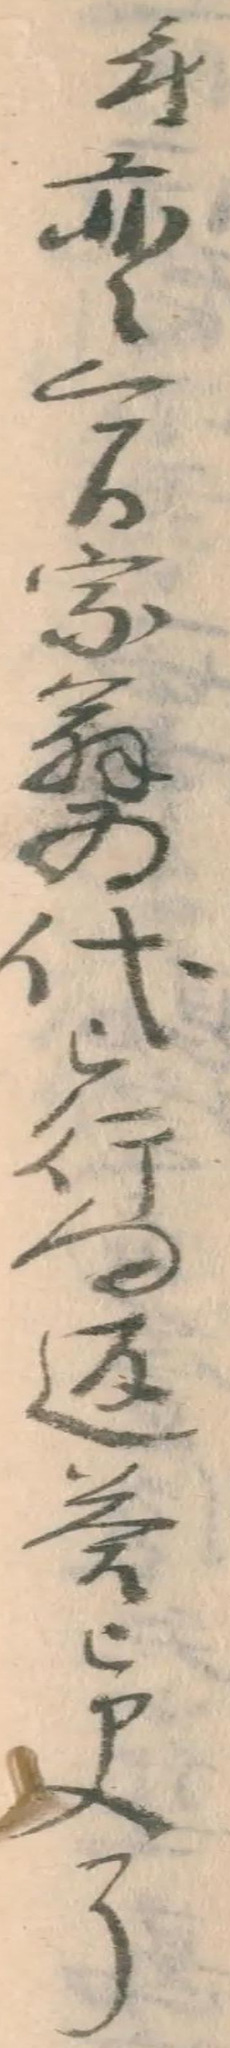ニ付亦々今日家翁為代被行向返答被申入了
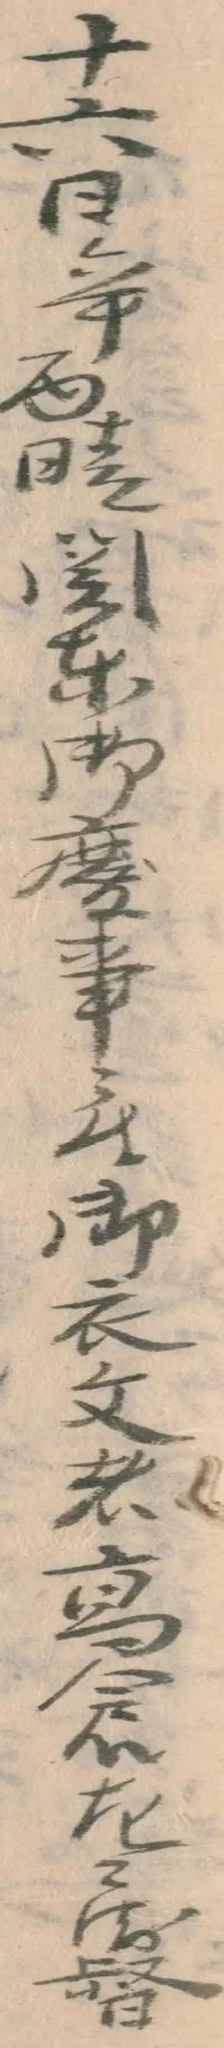十六日辛酉晴関東御慶事ニ付御衣文者高倉左兵衛督
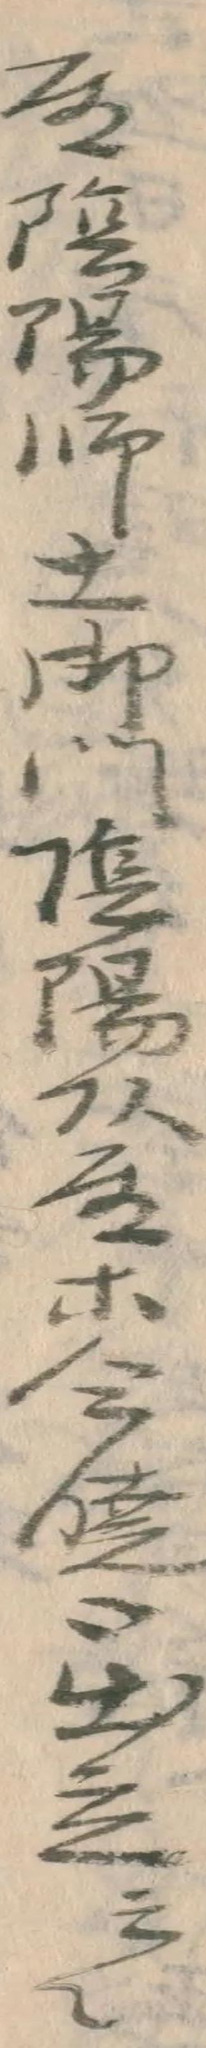殿陰陽師土御門陰陽頭殿等今暁御出立云々
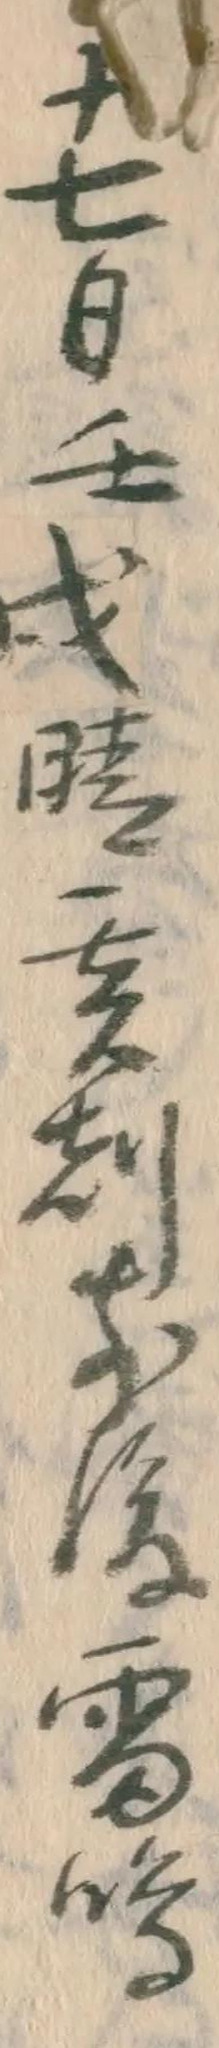十七日壬戌晴亥刻前後雷鳴
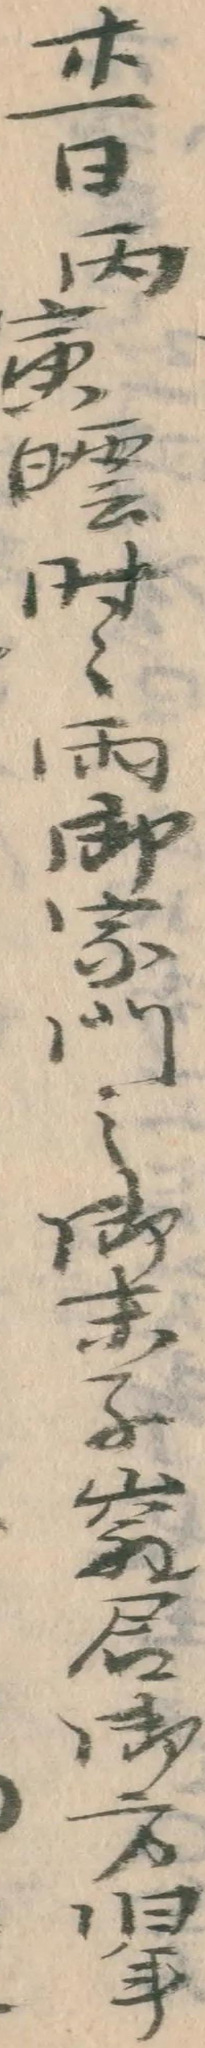廿一日丙寅雲時々両御家門之御末子嵡君御方旧年
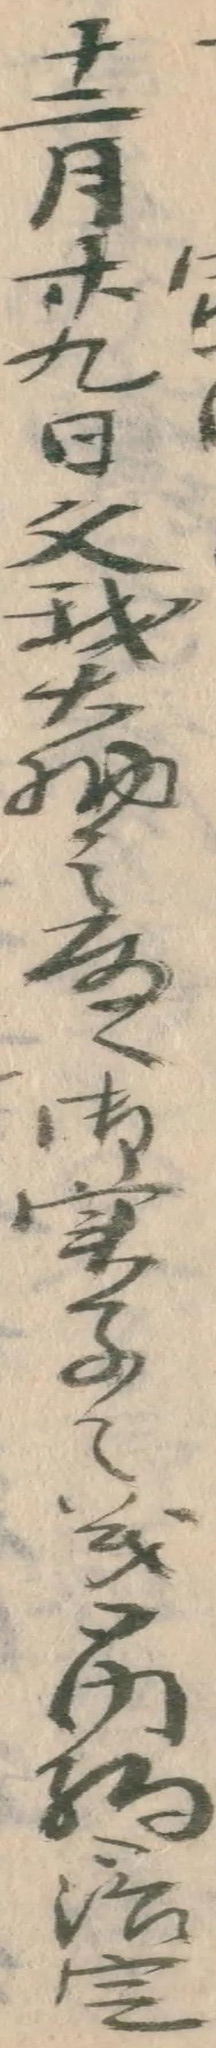十二月廿九日久我大納言殿へ御実子之義御内約御治定
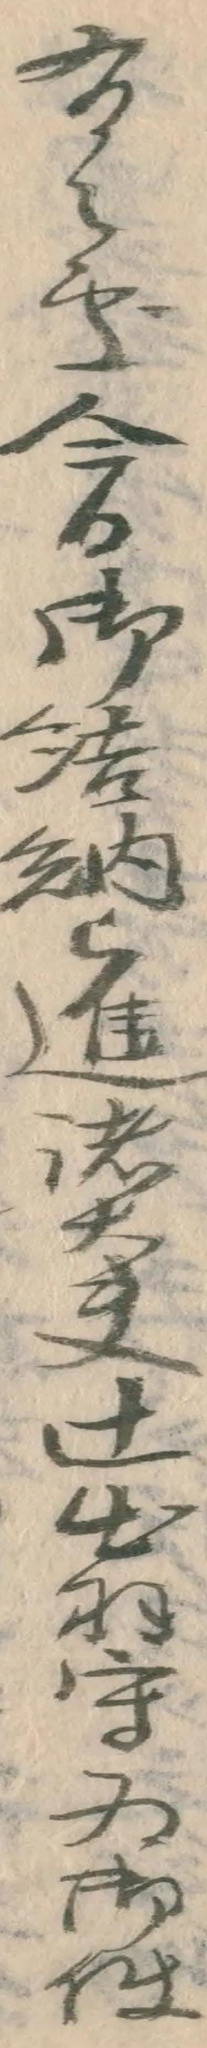有之處今日御詰納被進諸大夫辻出羽守為御使
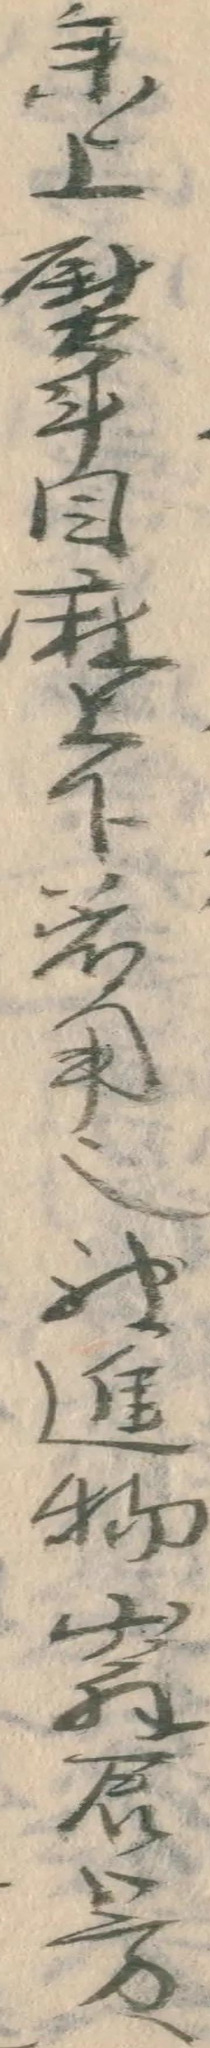参上熨斗目麻上下着用也被神進物嵡君御方へ
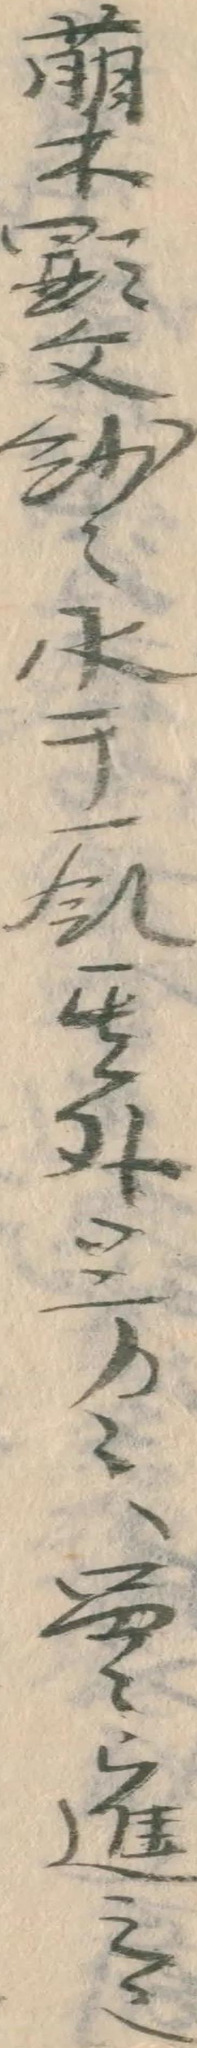萌木顕文紗之水干一領其外御方々へ品々被進之候也
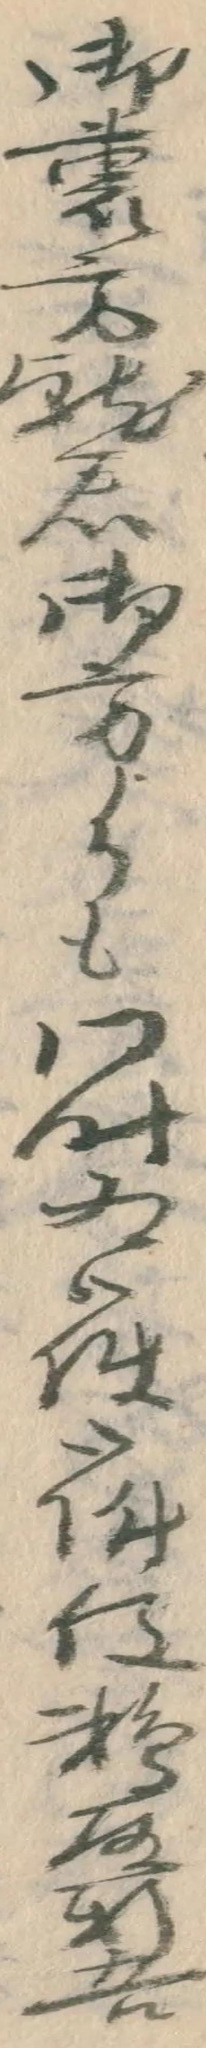御裏方聴君御方ゟも同時為御使御附役殿軒吾
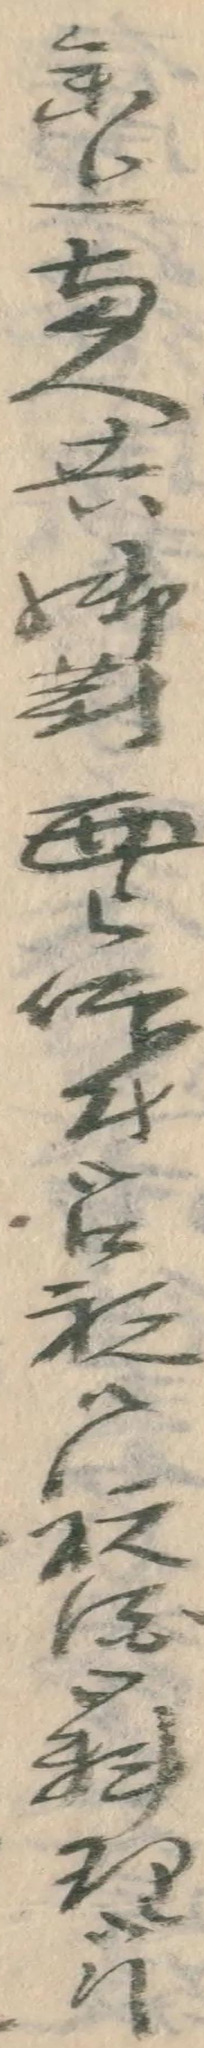参上両人共御對面被仰付御口祝御祝儀御料理御引
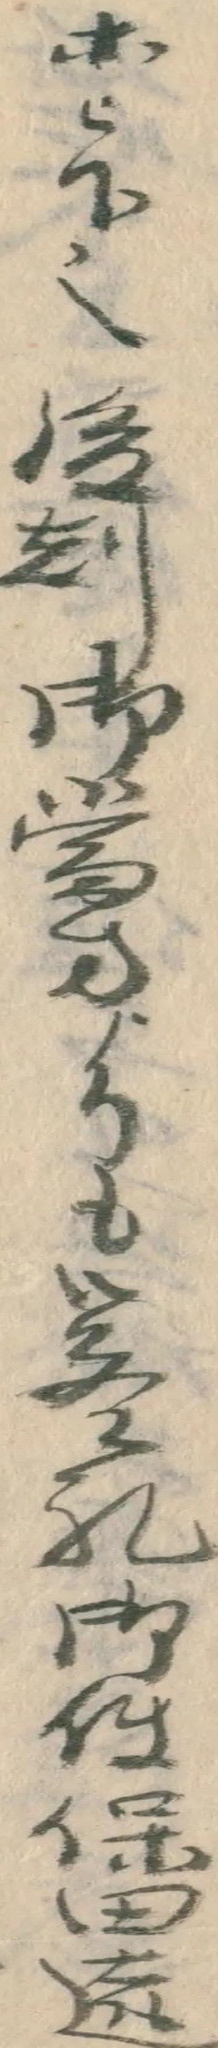等被下之後刻御當方よりも御容礼御任保田遠
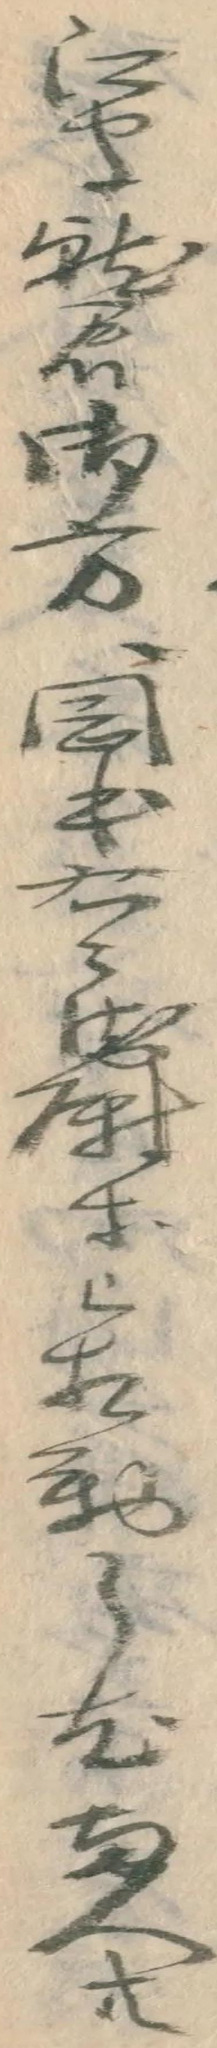江守就君御方へ岡本右兵衛尉等被相勤候尤両人共

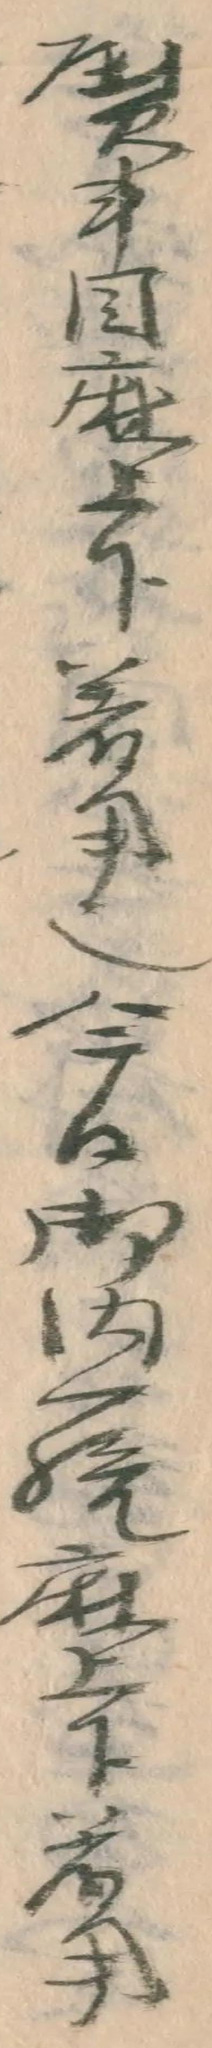熨斗目麻上下着用也今日御内一統麻上下着用
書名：賀茂社記録. 第63冊
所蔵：国立国会図書館 National Diet Library, JAPAN
